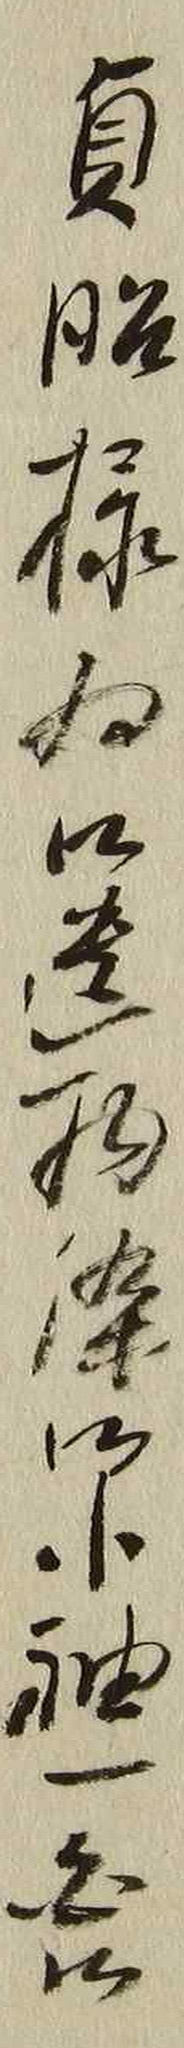貞昭様為御遺物染御小袖一白御
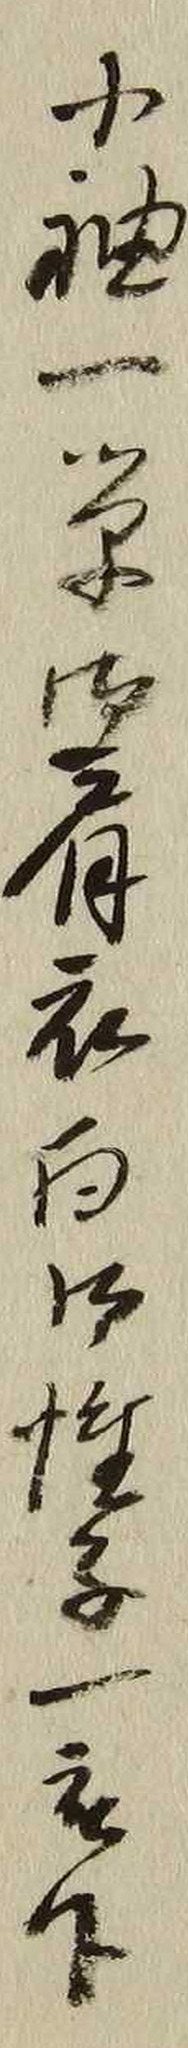小袖一単御肩衣白御帷子一被下
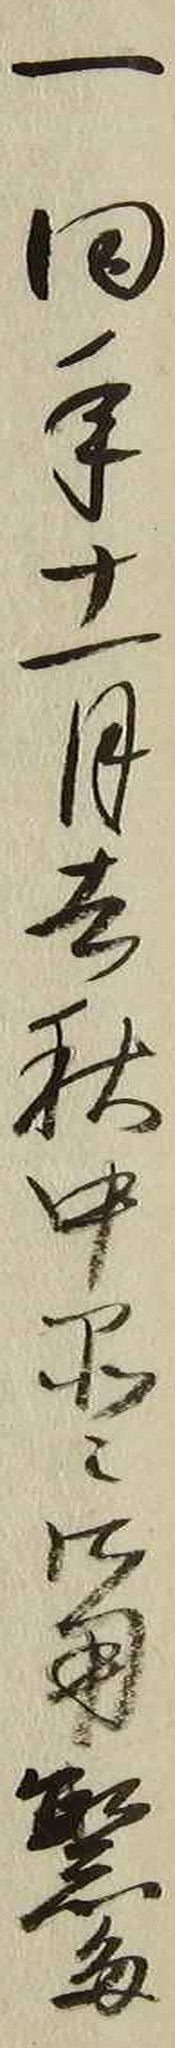一同年十一月去秋中品々御用繁多
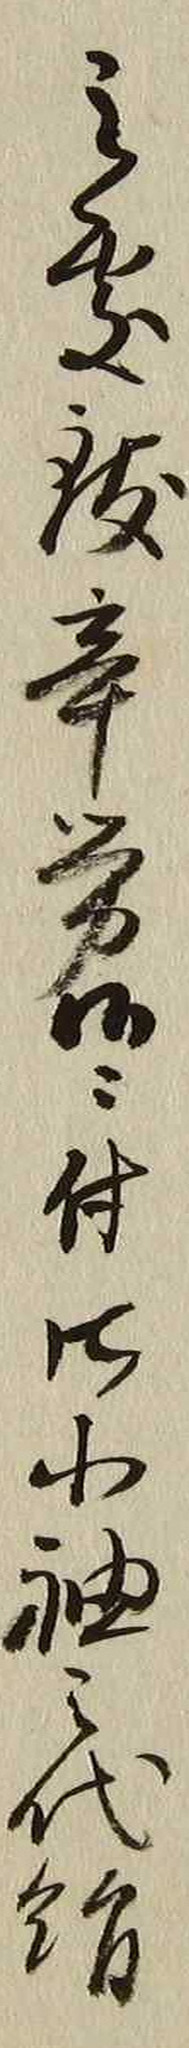之処致辛労候ニ付御小袖之代絹
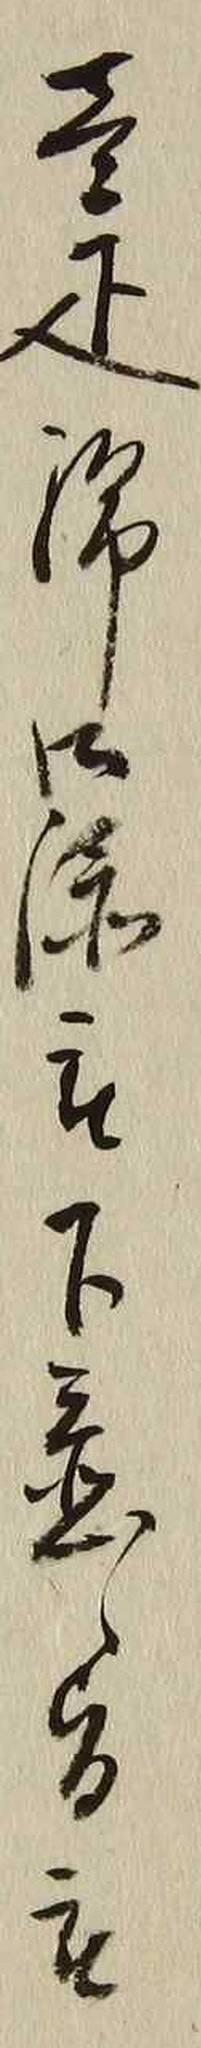壱疋綿御添被下置候旨被
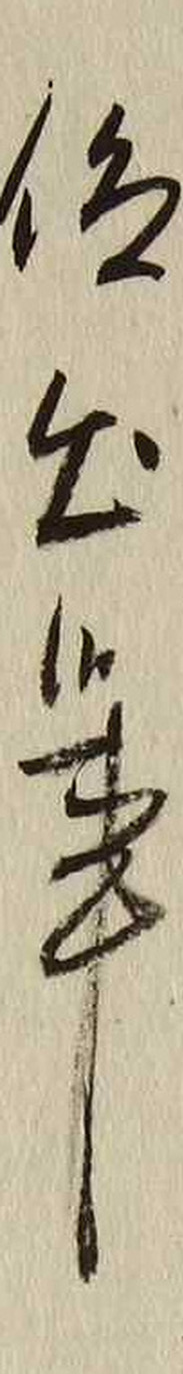仰出候事
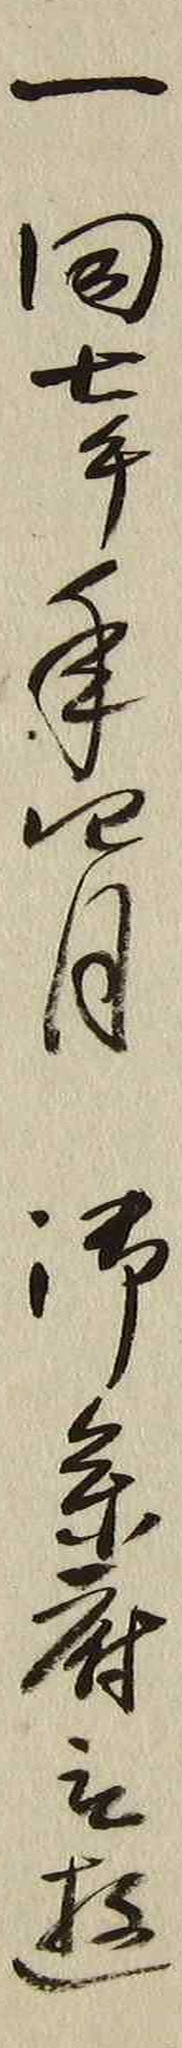一同七午年四月御参府被遊
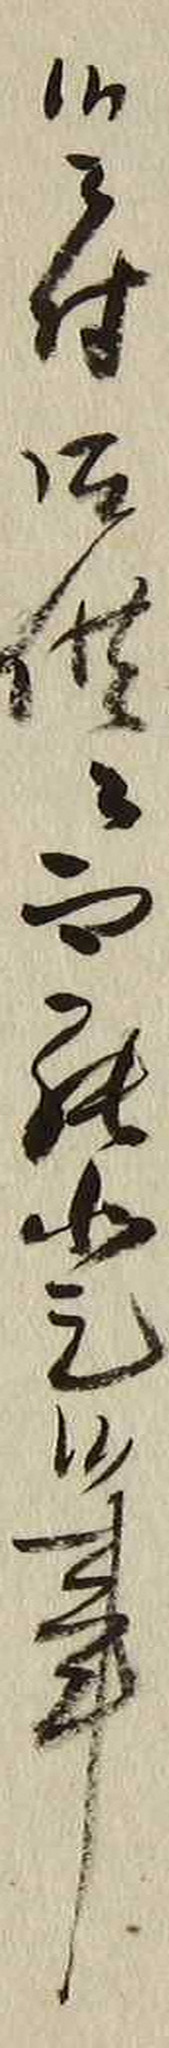候ニ付御供ニ而罷登候事
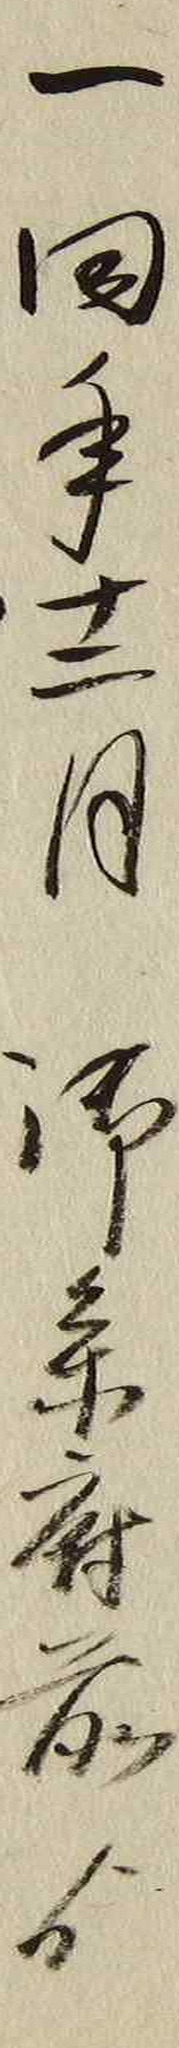一同年十二月御参府前ゟ
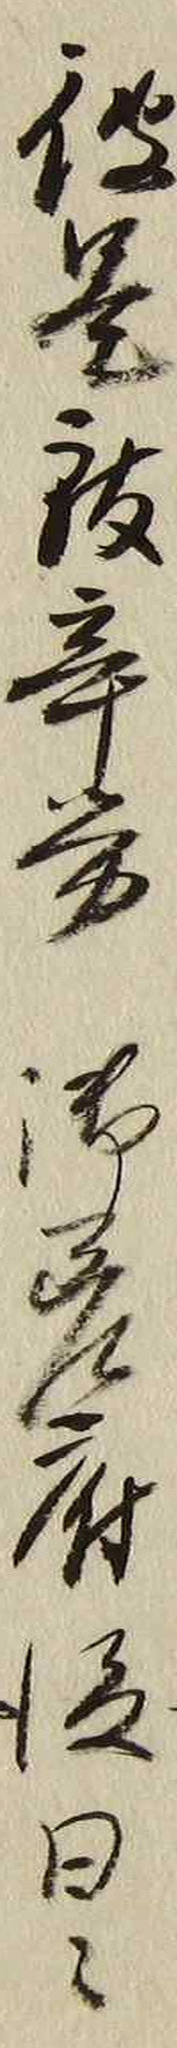彼是致辛労御着府後日々
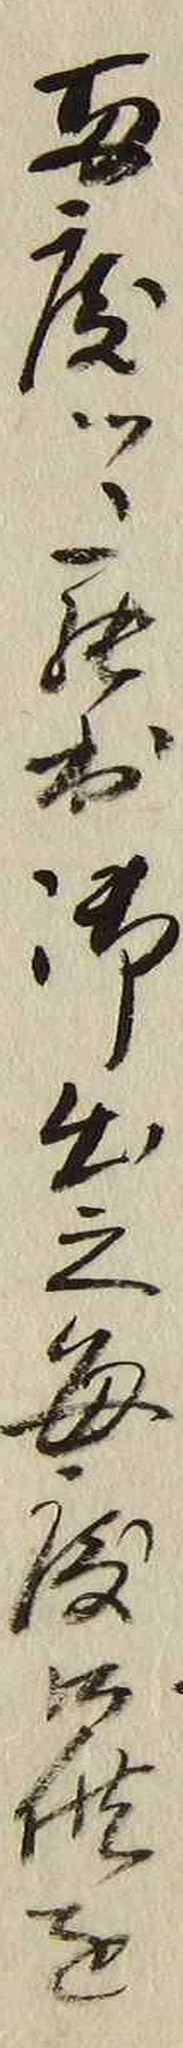両度ツヽ罷出御出之毎度御供を
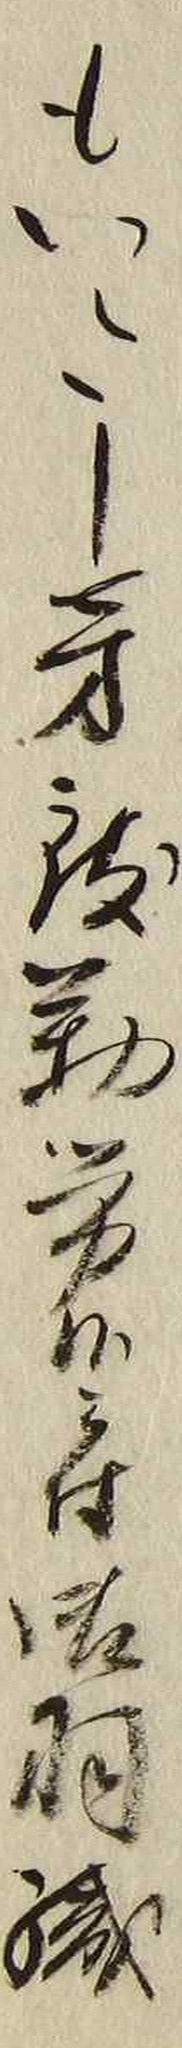もいたし旁致勤労候ニ付御羽織

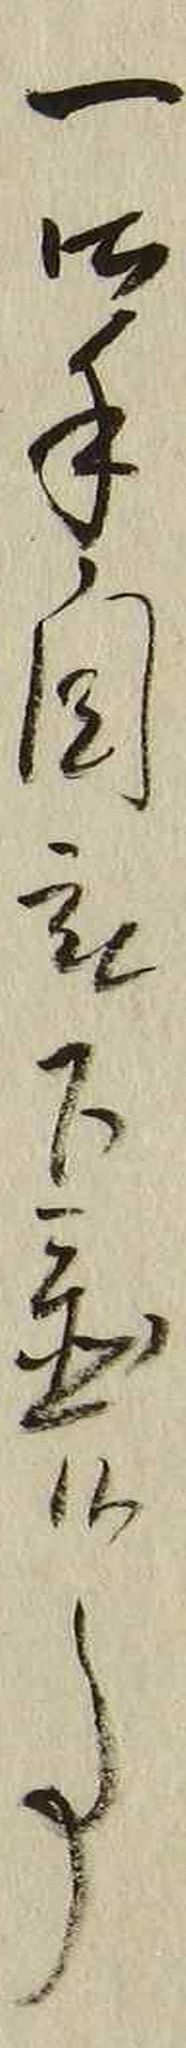一御手自被下置候事
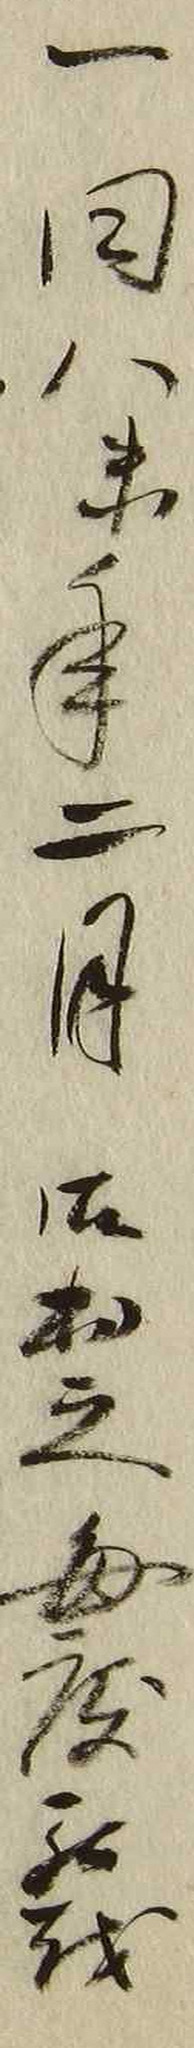一同八未年二月御出之毎度罷越
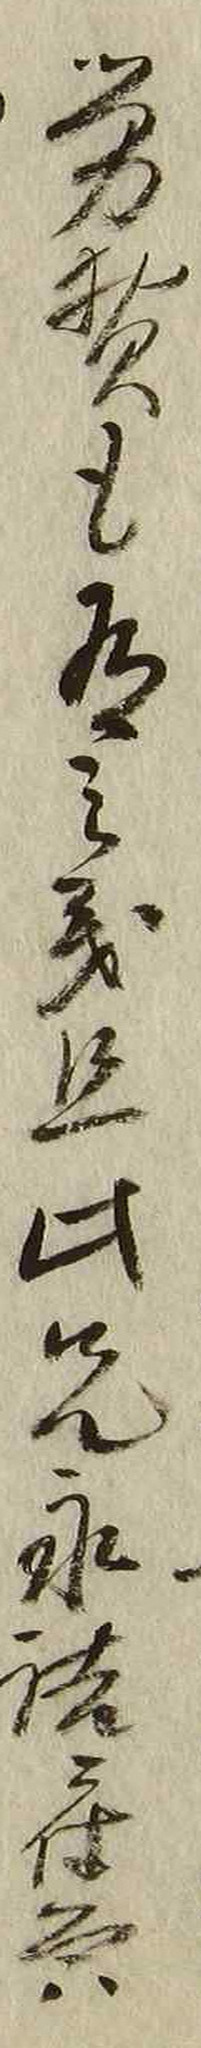労費も有之義且此先永詰ニ付而ハ
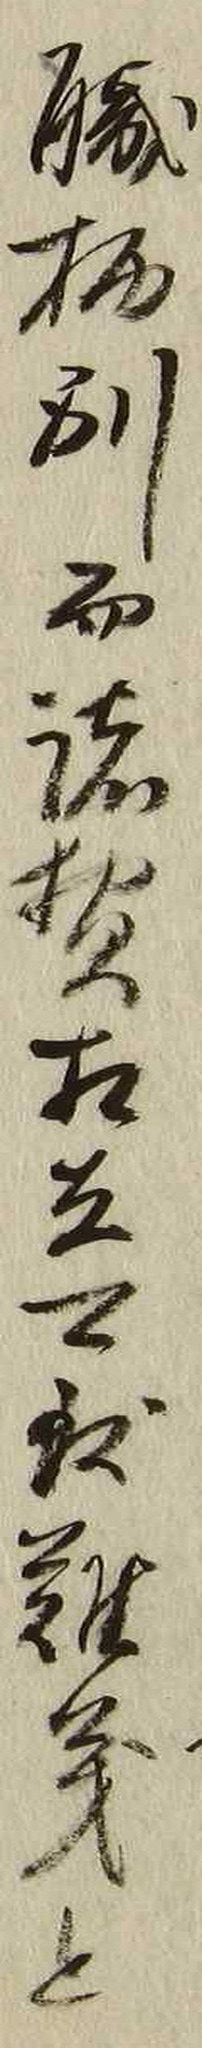職柄別而諸費相立可致難義と
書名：諸士系譜　巻之351　す之部1
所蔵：会津若松市立会津図書館
